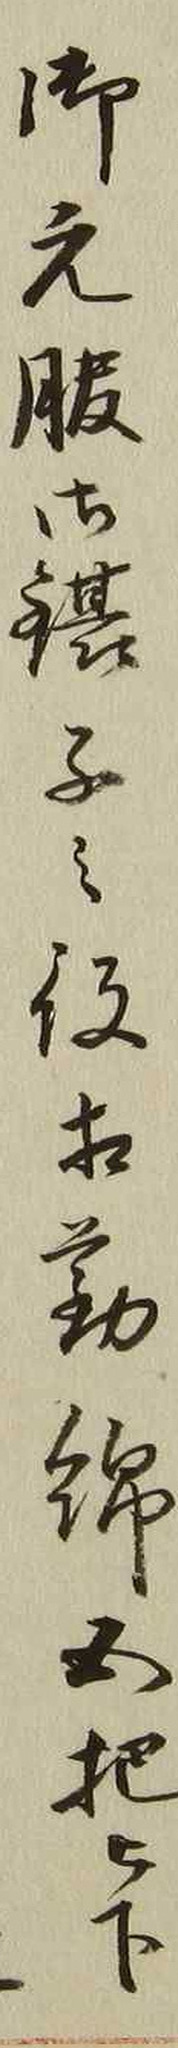御元服御錯子之役相勤綿五把被下
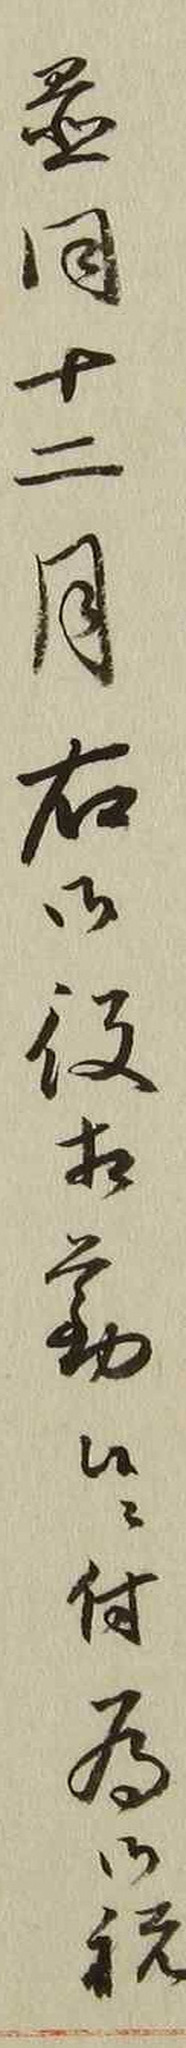置同十二月右御役相勤候に付為御祝
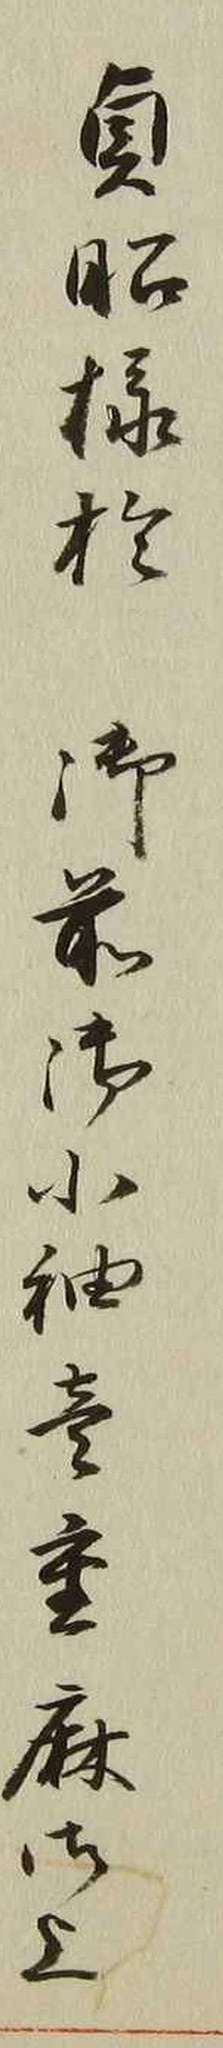貞昭様於御前御小袖壱重麻御上
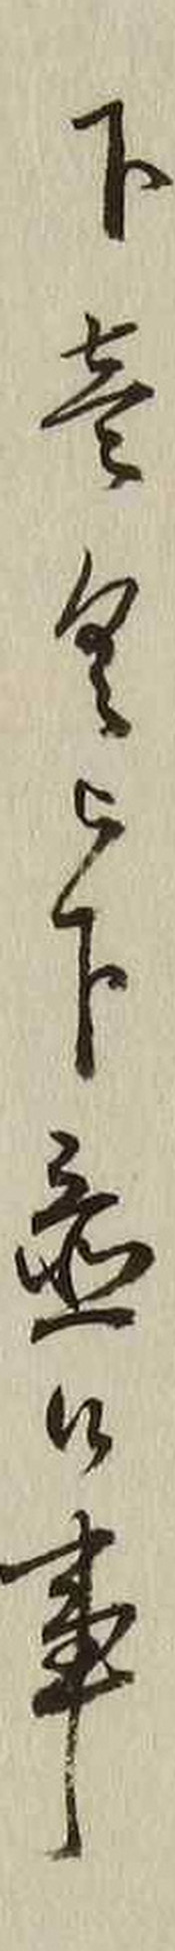下壱具被下置候事
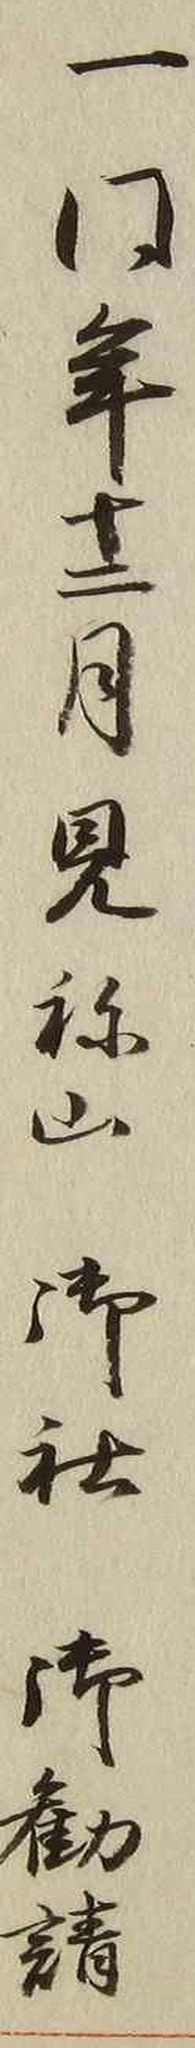一同年十二月見祢山御社御勧請
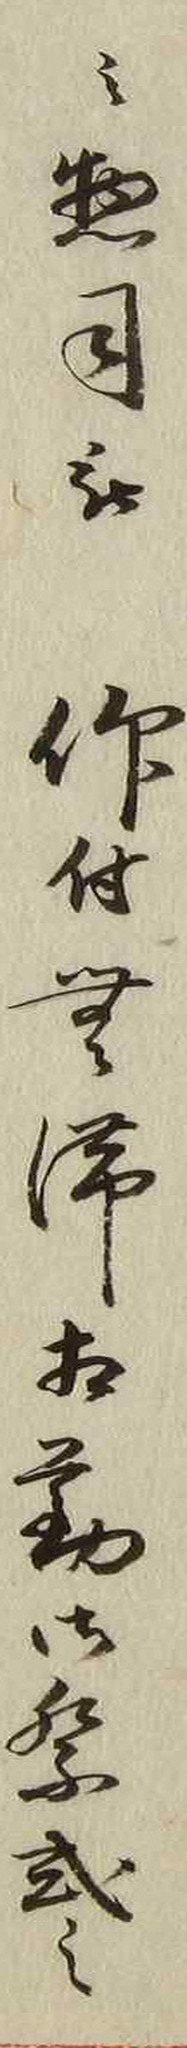之惣司被仰付無滞相勤御祭式之
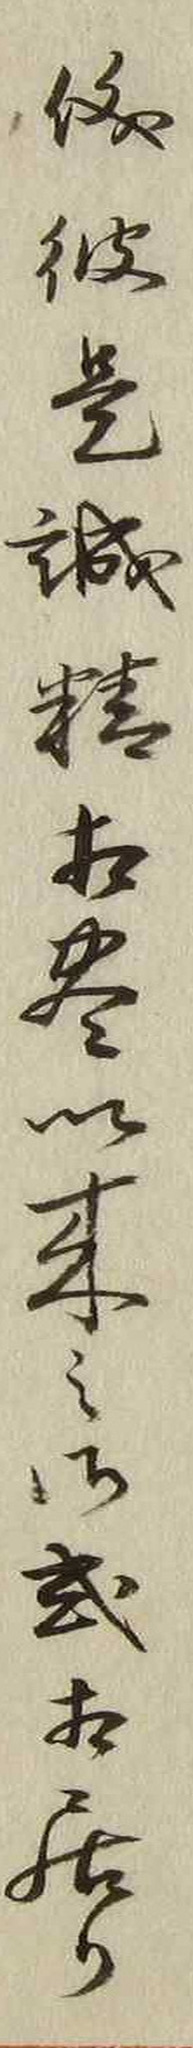儀彼是誠精尽以来之御式相居り
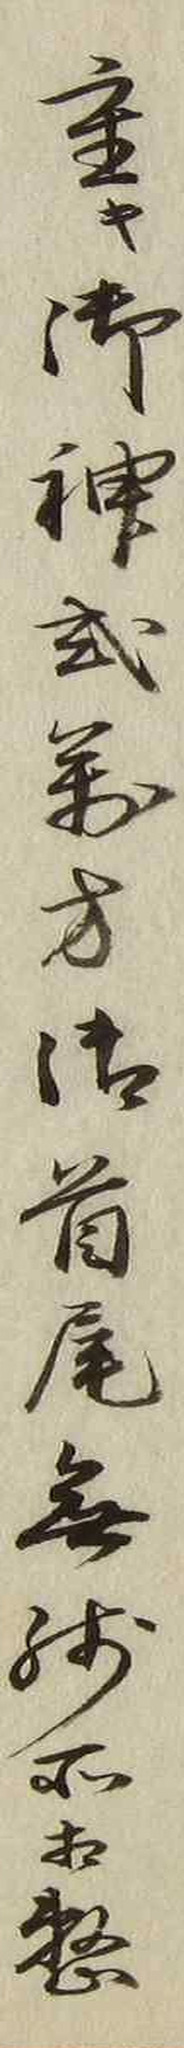重キ御神式萬方御首尾無残所相整
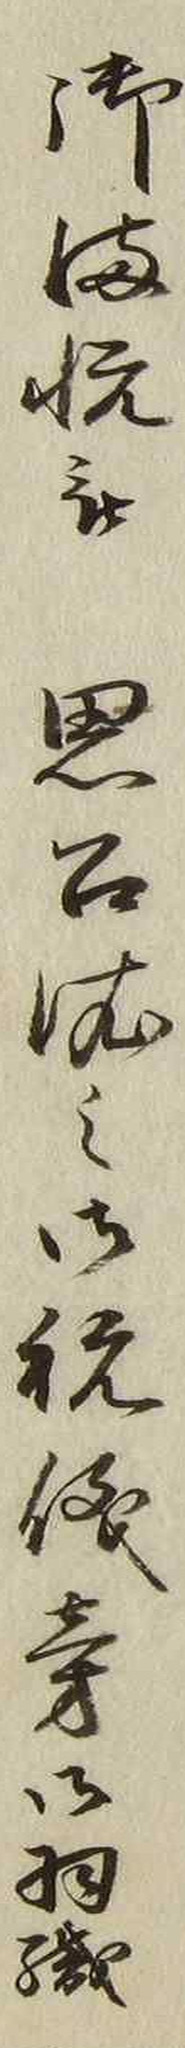御満悦被思召依之御祝儀旁御羽織
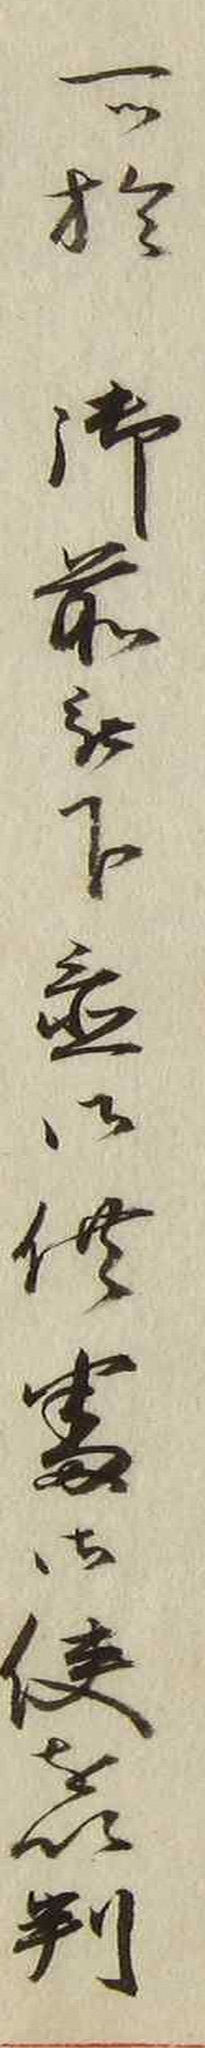一つ於御前被下置御供番御使を以判
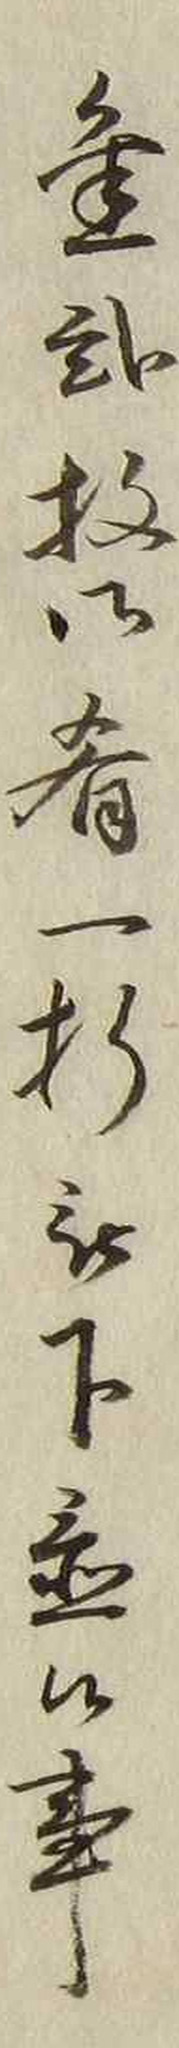金弐枚御肴一折被下置候事
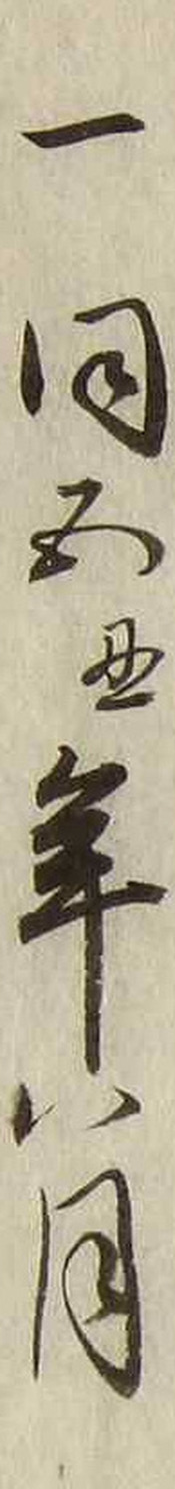一同五丑年八月

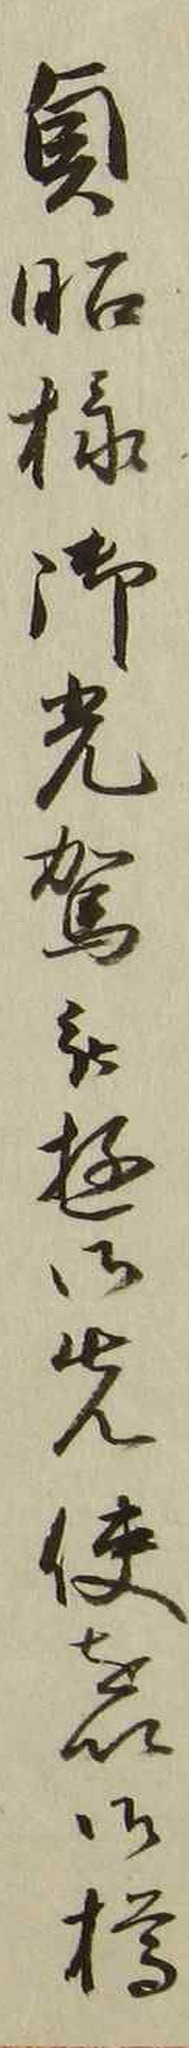貞昭様御光駕被遊御先使を以御樽
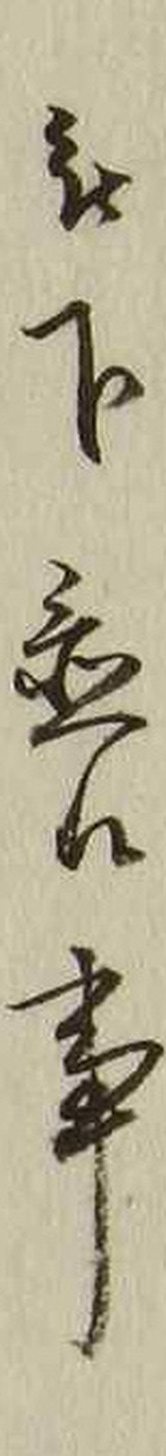被下置候事
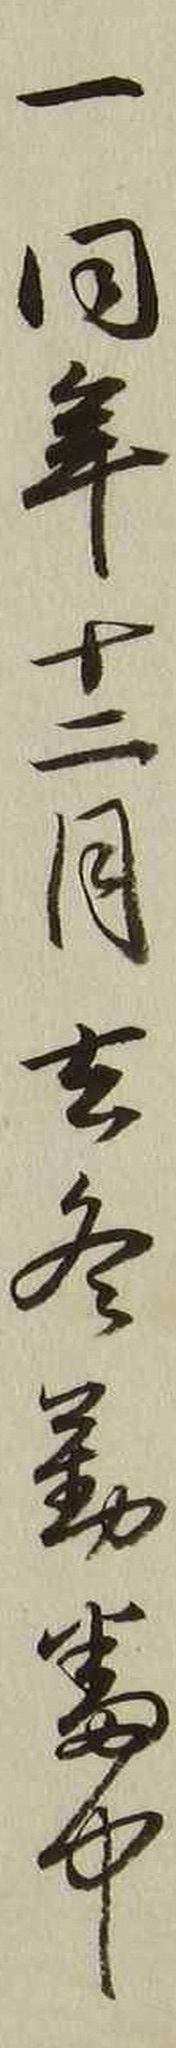一同年十二月去冬勤番中
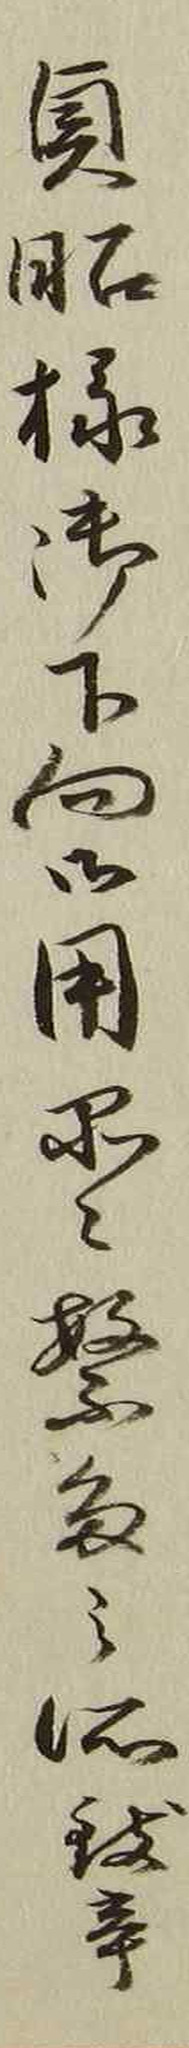貞昭様御下向御用品々繁多之所致辛
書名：諸士系譜　巻之125　た之部1
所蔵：会津若松市立会津図書館
